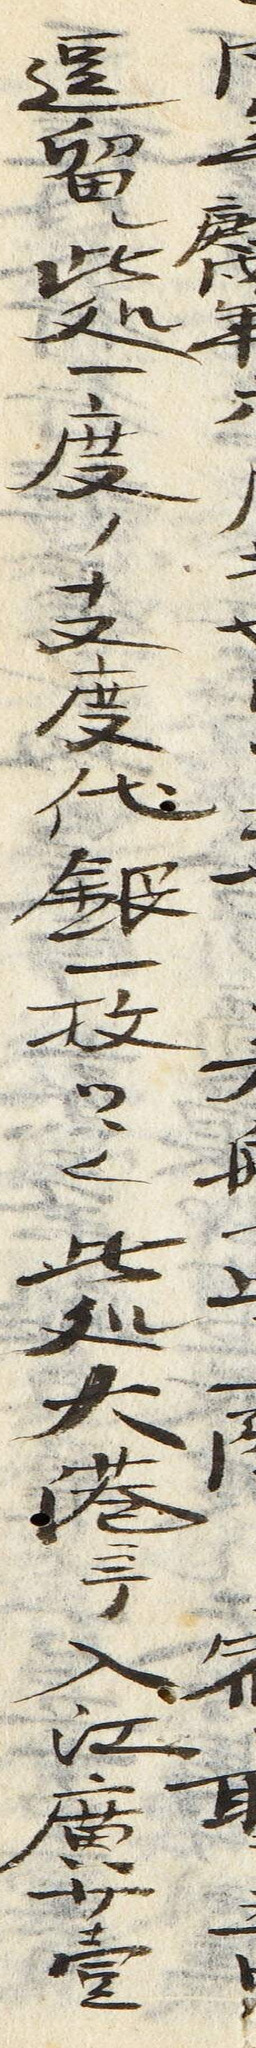逗留シ此処一ノ支度代銀一枚ツヽ也此処大港ニテ入江広サ壱

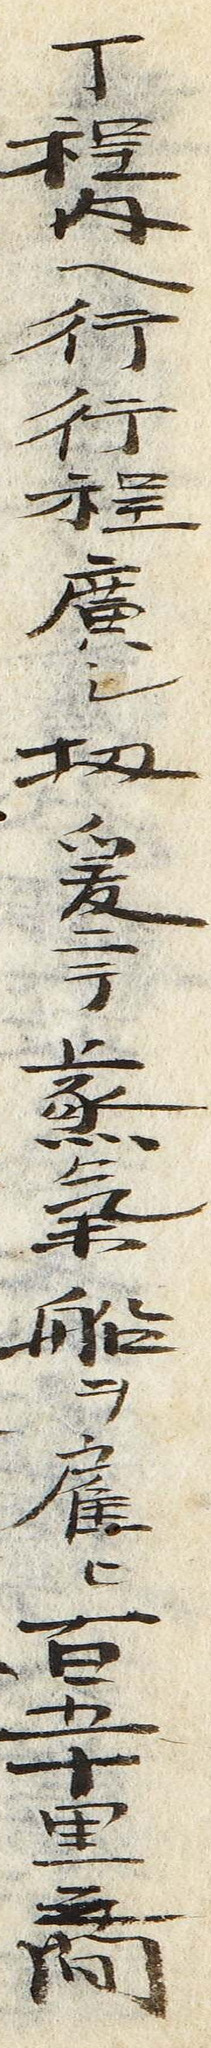丁程内ヘ行行程広シ扨爰ニテ蒸気船ヲ雇ヒ百五十里の間
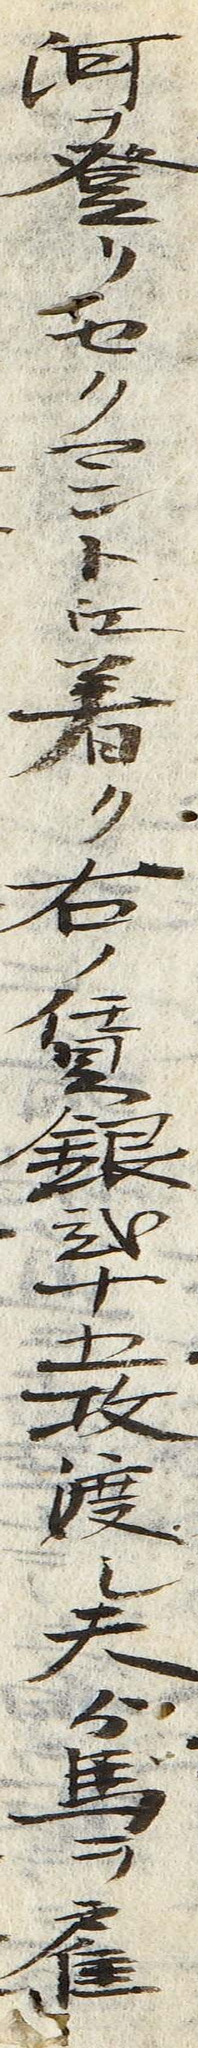河ヲ登リイセクマントえ着ク右ノ賃銀弐十五枚渡シ夫ゟ馬ヲ雇
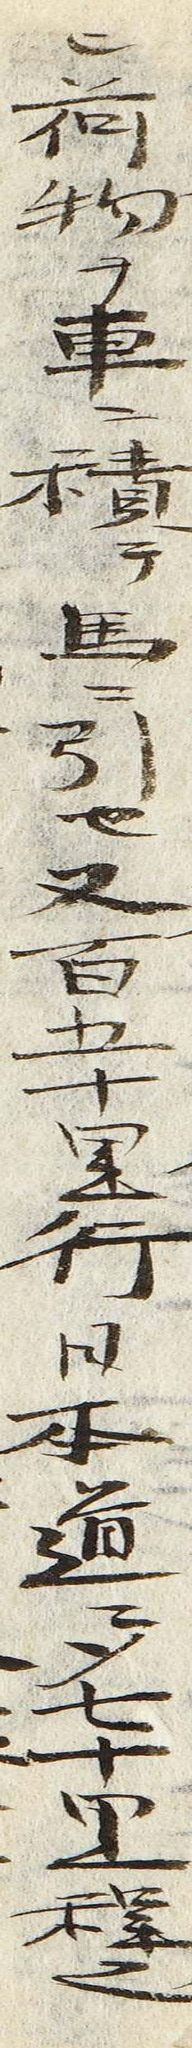ヒ荷物ヲ車ニ積テ馬ニ引セ又百五十里行日本道ニ〆七十里程也
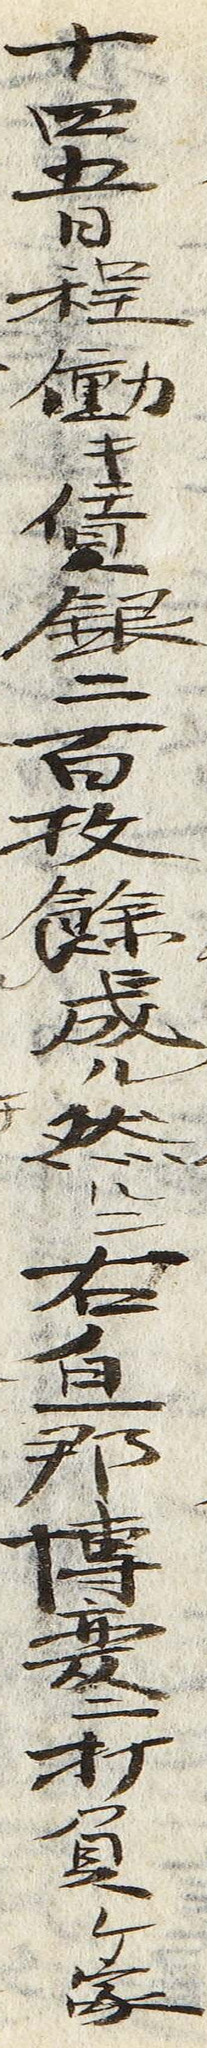十四五日程働キ賃銀二百枚余ニ成ル然ルニ右ノ旦那博奕ニ打負ケ家
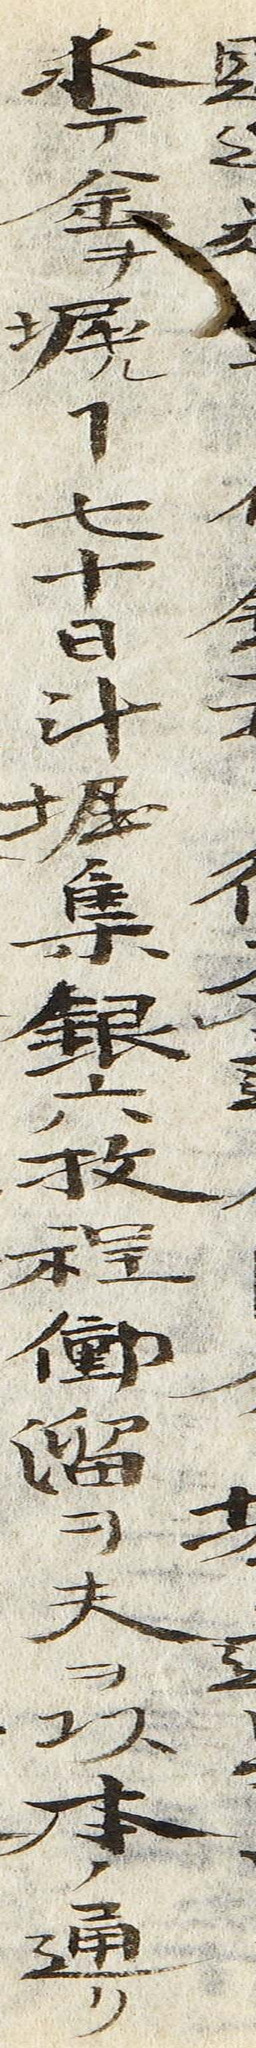求テ金ヲ掘ル事七十日計堀集銀六枚程働溜ヲ夫ヲ以本ノ通リ
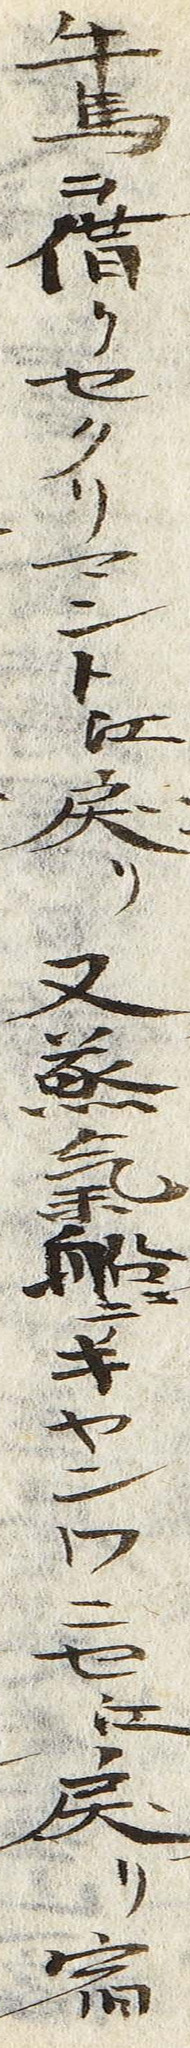牛馬ヲ借リセクリマントへ戻リ又蒸気船ニテキヤンワニセえ戻リ宿
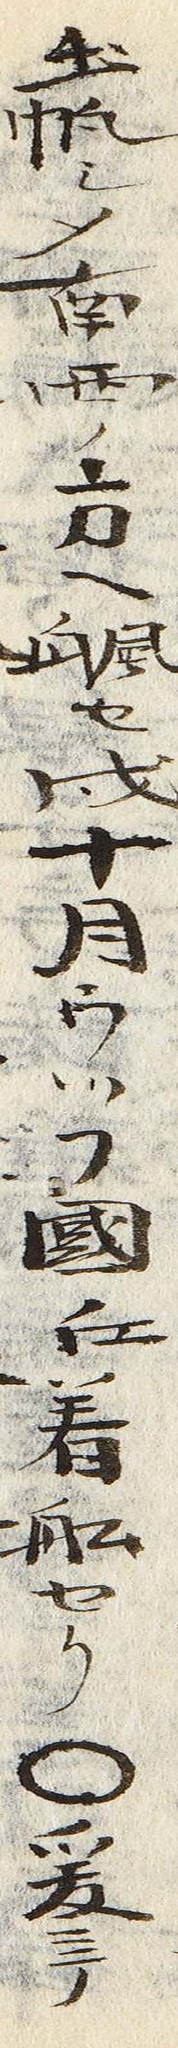出航シメ南西ノ方へ帆セ戌十月ウツフ国へ着船セリ〇爰ニテ
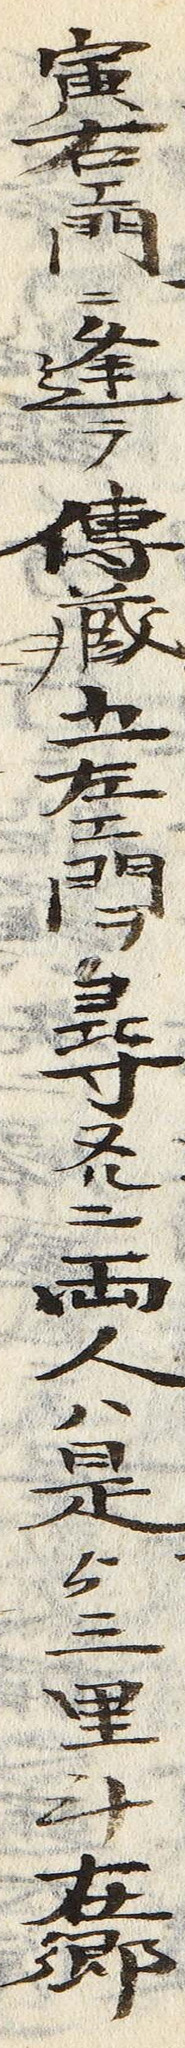寅右衛門ニ逢テ傳蔵五左衛門ヲ尋ヌルニ両人ハ是ゟ三里計在郷
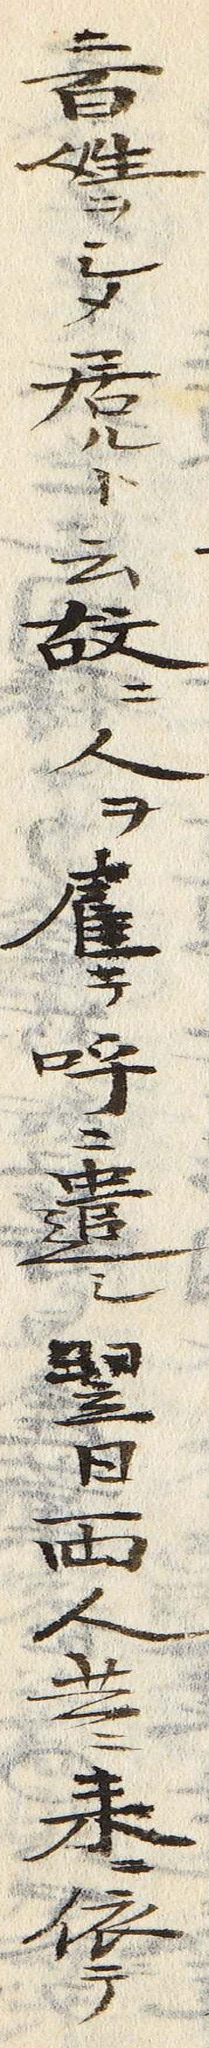ニ百姓ヲシメ居ルト云故ニひヲ雇テ呼ニ遣シ翌日両人共ニ来ニ依テ
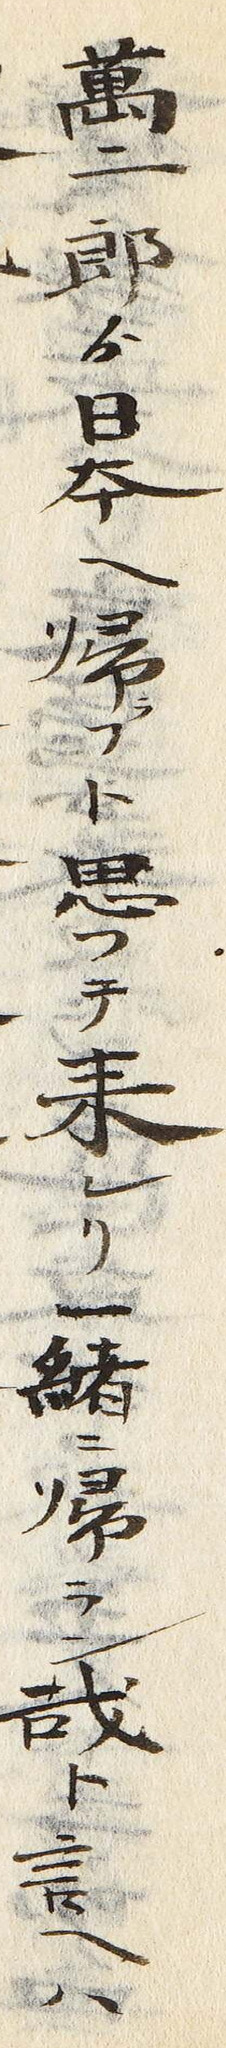萬二郎ゟに日本ヘ帰ラフト思フテ来レリ一緒ニ帰ラン哉ト言ヘハ
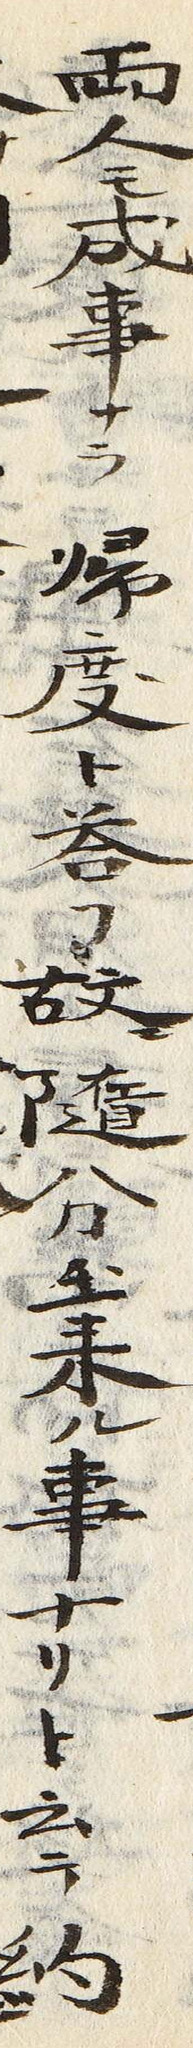両人モ成事ナラ帰度ト答フ故ニ随分出来ル事ナリト云テ約
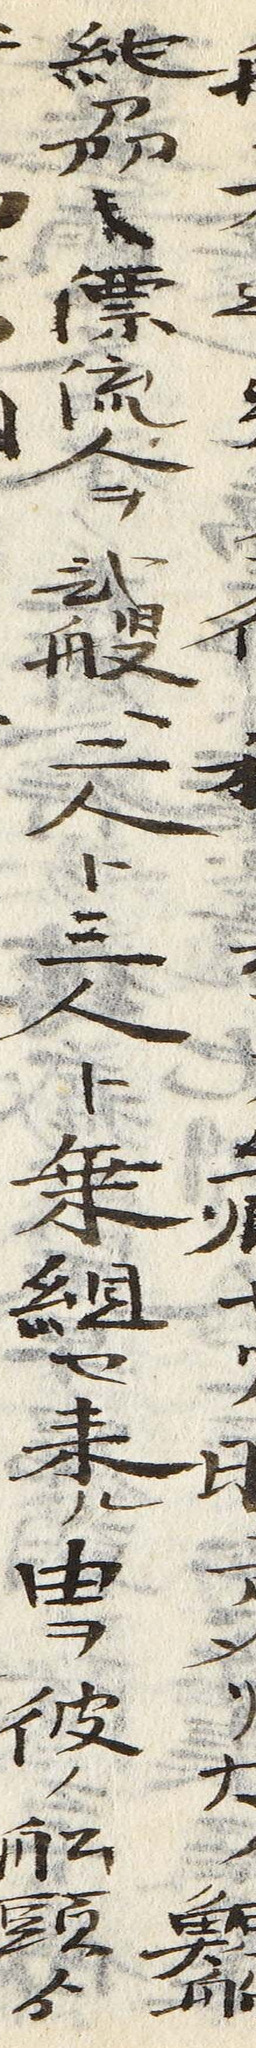紀州漂流人ヲ弐艘へ二人ト三人ト乗組セ来ル由ヲ彼ノ船頭ゟ
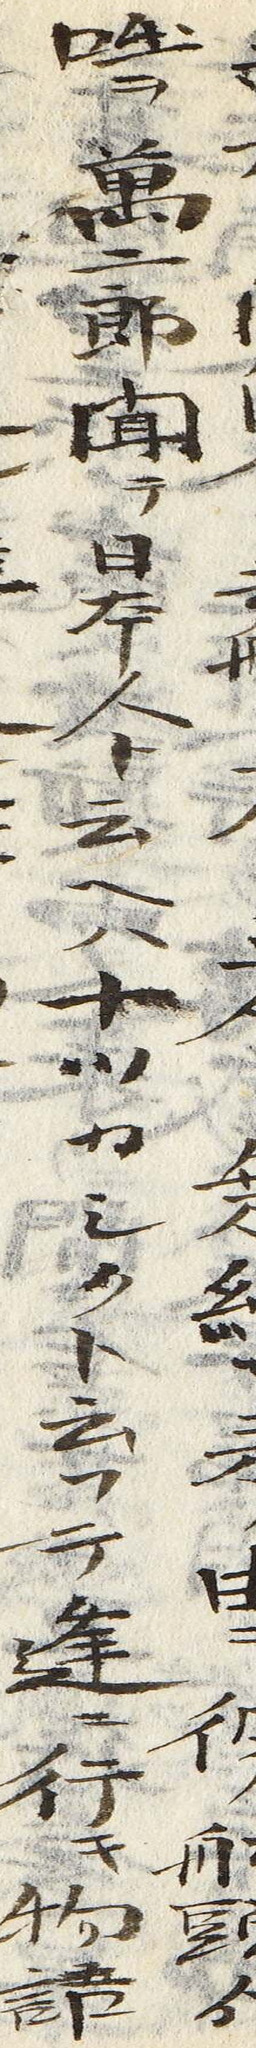吐ヲ萬二郎聞テ日本人ト云ヘハナツカシクト云フテ逢ニ行キ物語
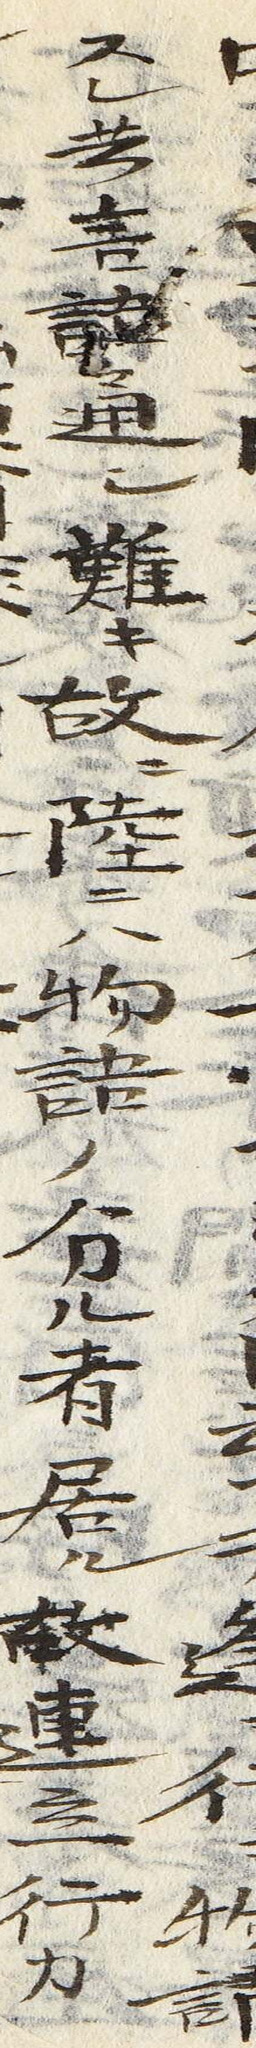スレ共言葉通シ難キ故ニ陸ニハ物語ノ分ル者居ル故連立行カ
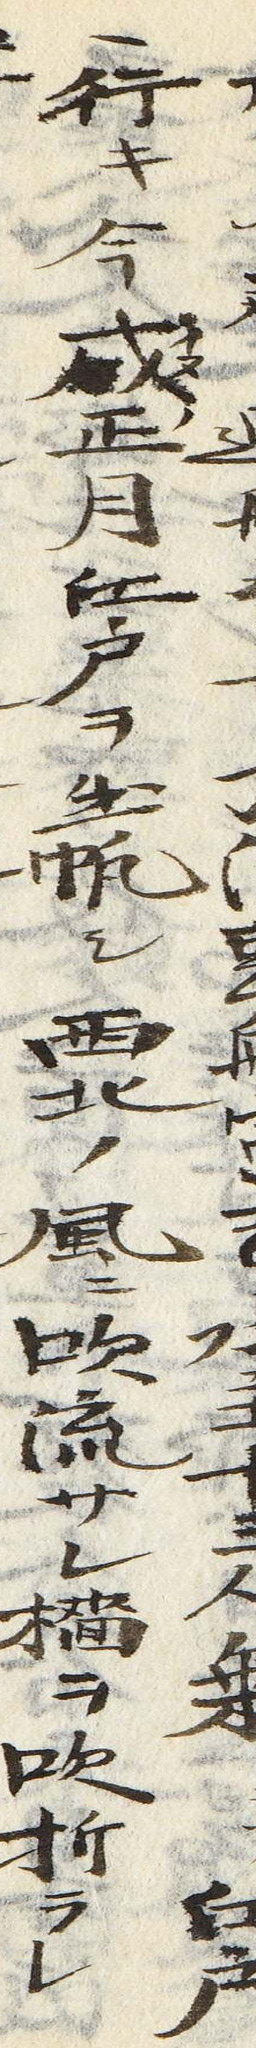ヘ行キ今戌正月江戸ヲ出航シ西北ノ風ニ吹流サレ檣ヲ吹折ラㇾ
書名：漂流記聞
